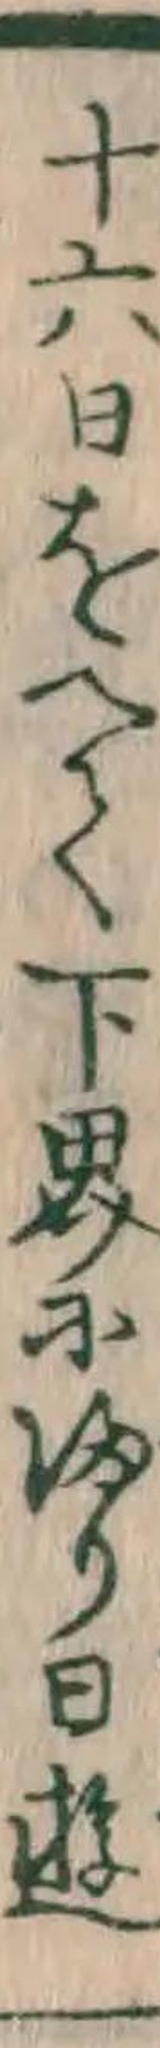十六日をへて下界に帰り日遊
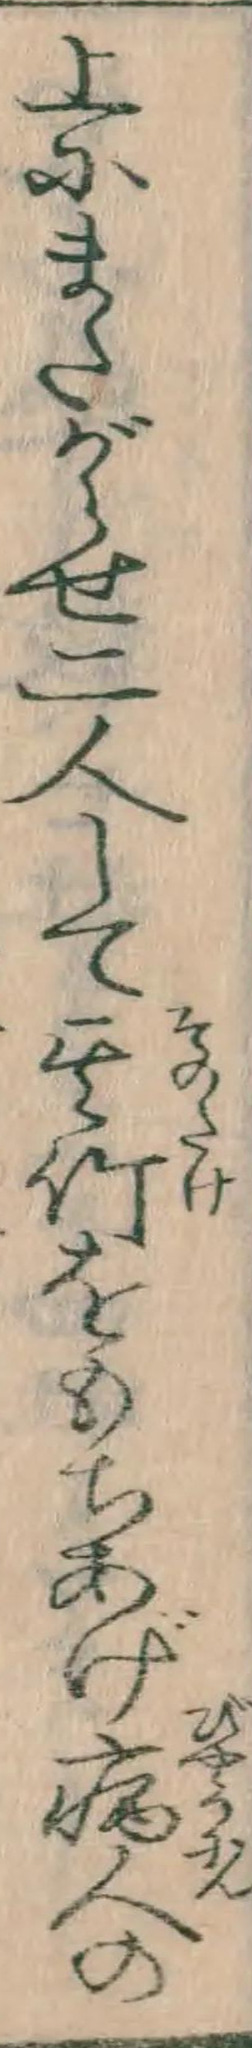上にまたがらせ二人して其竹をもちあげ病人の
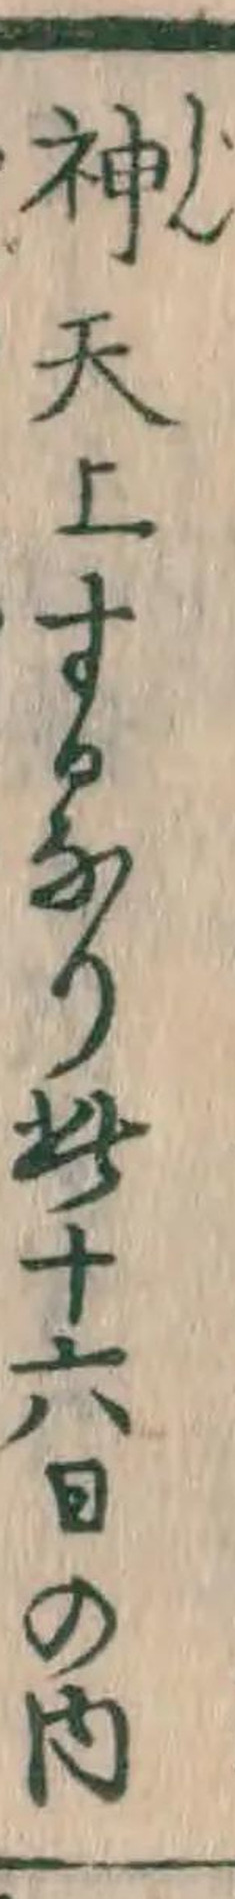神天上するなり此十六日の内
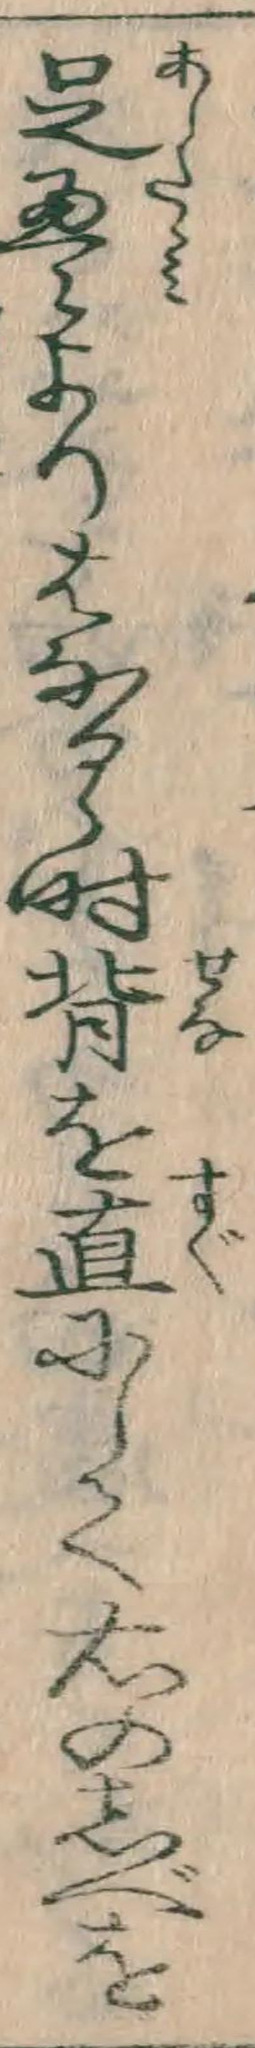足畳よりはなるゝ時背を直にして右のしべを
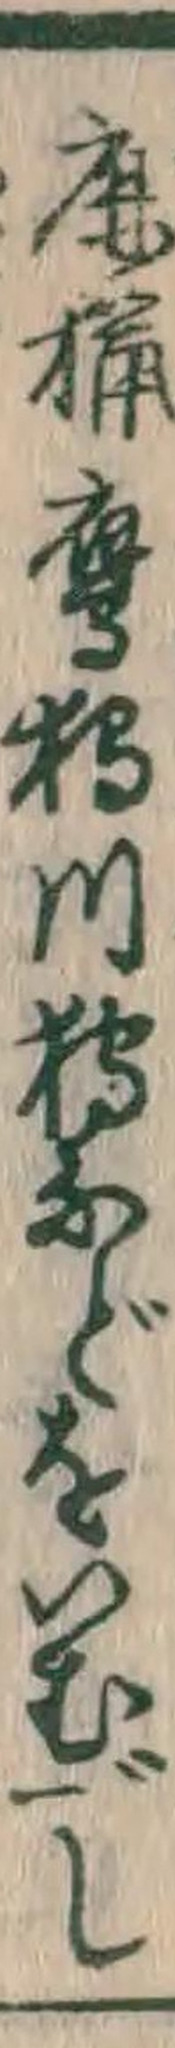鹿猟鷹狩川狩などをいむべし
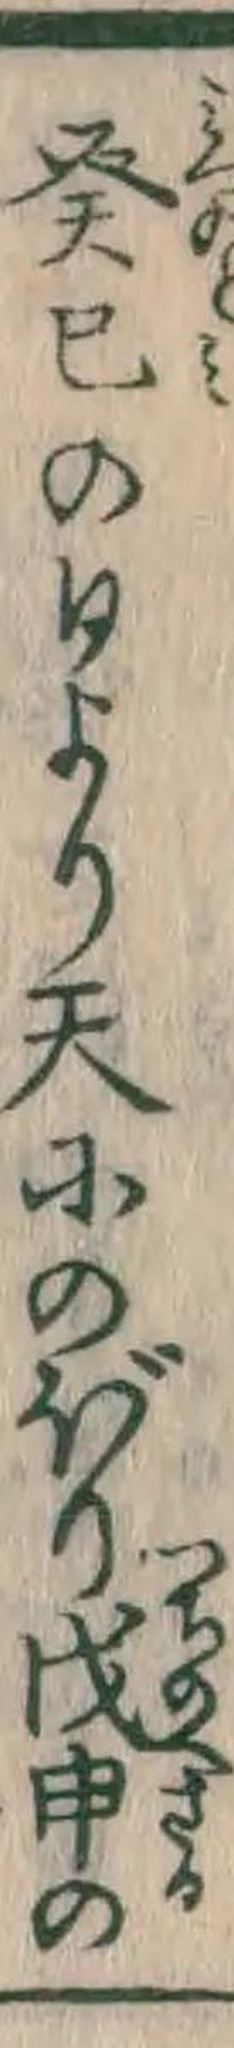癸巳の日より天にのぼり戊申の
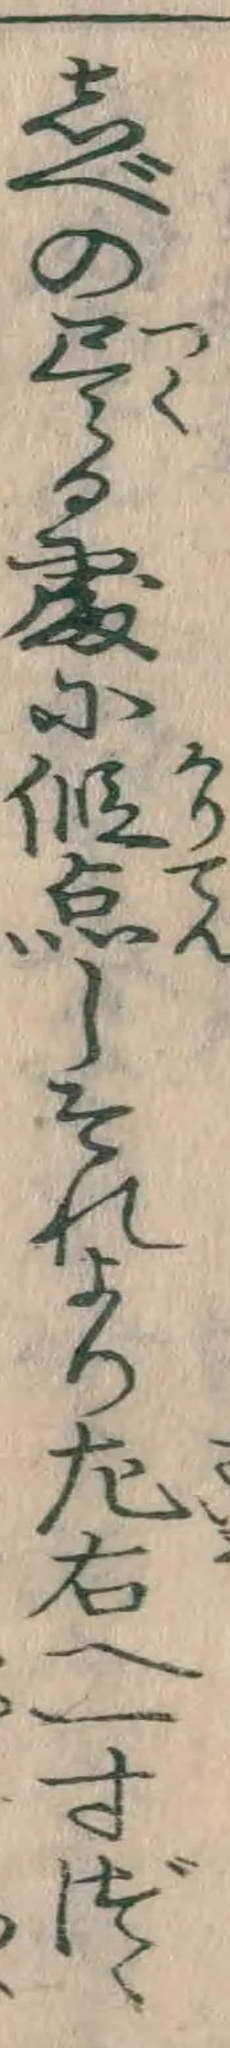しべの尽る処に仮点しそれより左右へ一寸づゝ
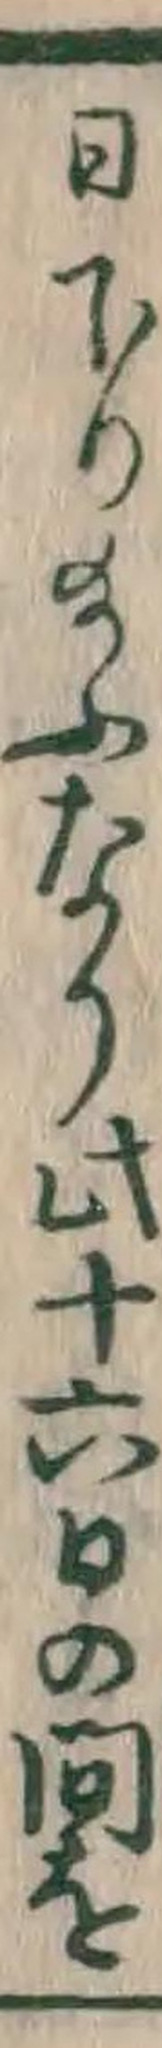日下り給ふなり此十六日の間を
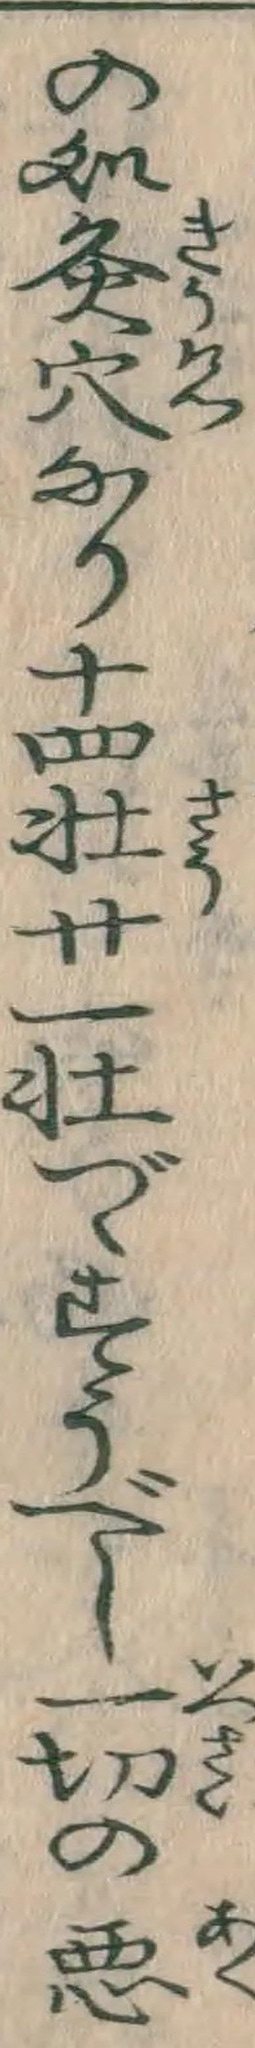の処灸穴なり十四壮廿一壮づゝすうべし一切の悪
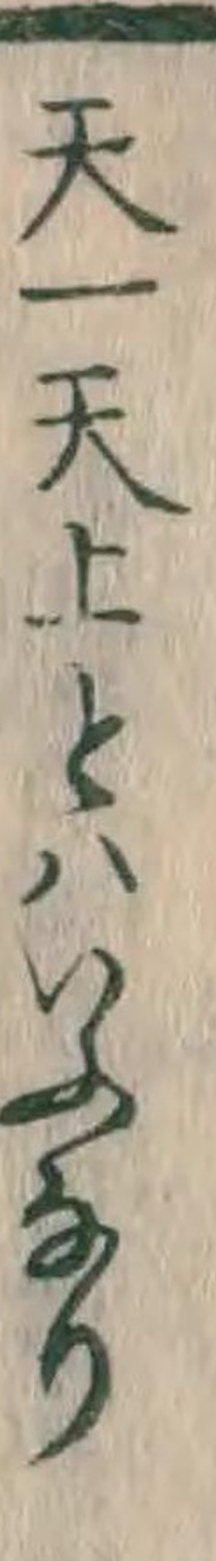天一天上とはいふなり
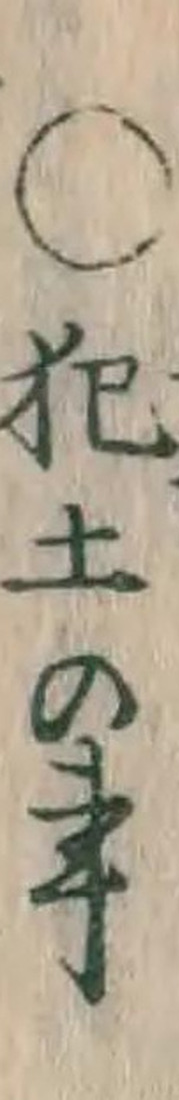○犯土の事
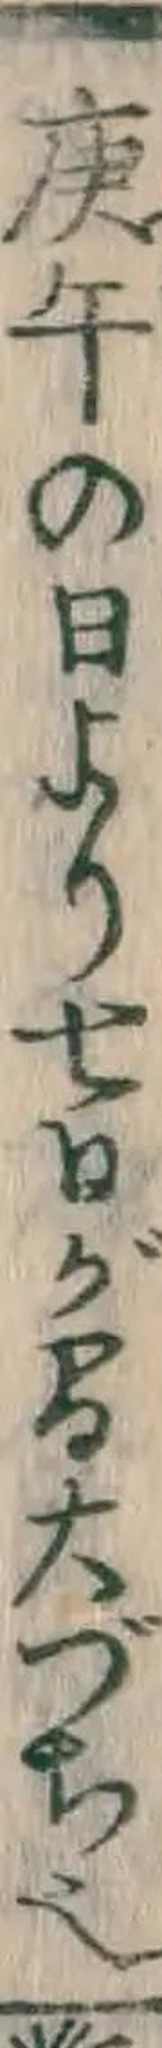庚午の日より七日が間大づち也
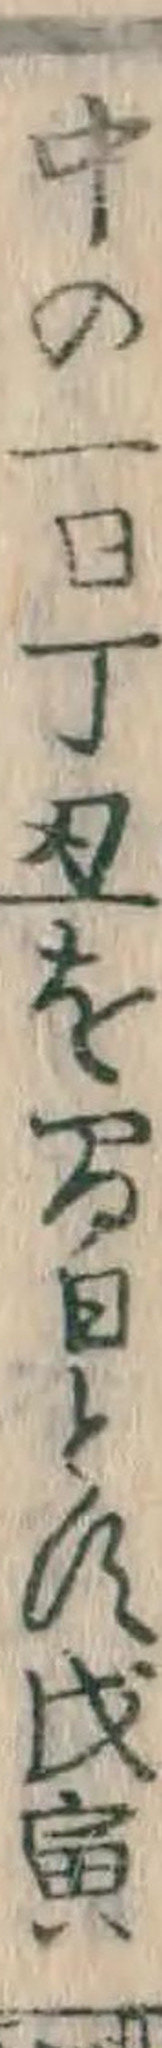中の一日丁丑を間日とす戊寅
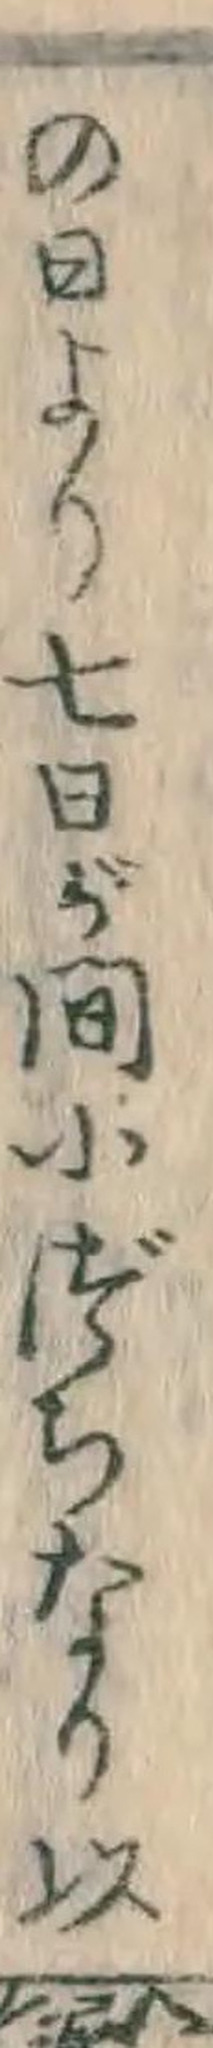の日より七日が間小づちなり以
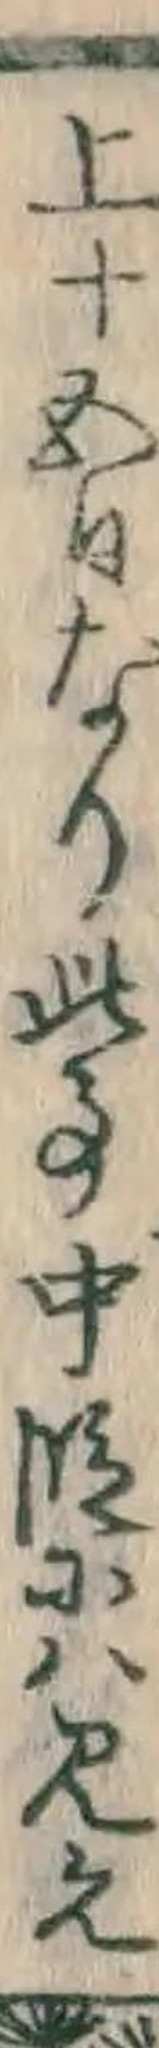上十五日なり此事中段には見え
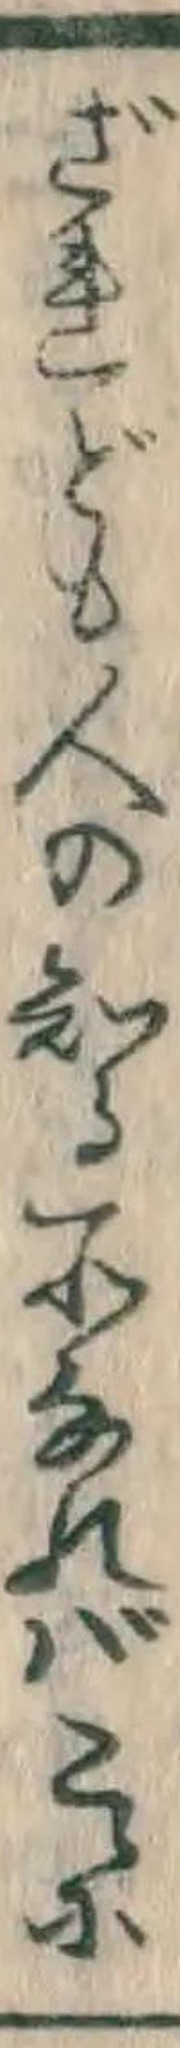ざれども人の知る所なればこゝに
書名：広益秘事大全 3巻. [4]
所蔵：国立国会図書館 National Diet Library, JAPAN
